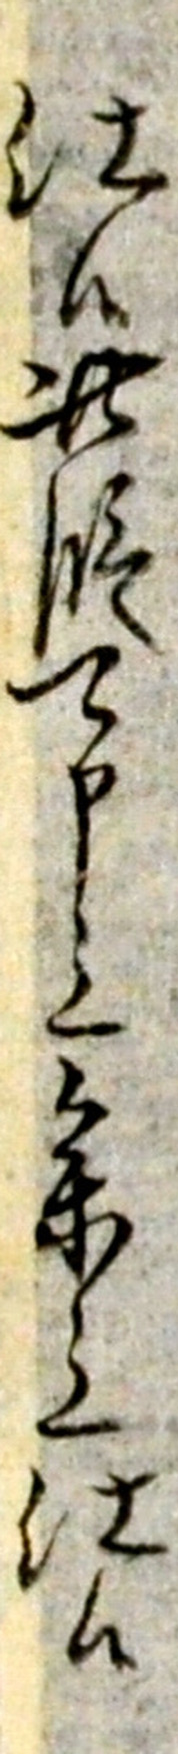仕候此段可申上参上仕候
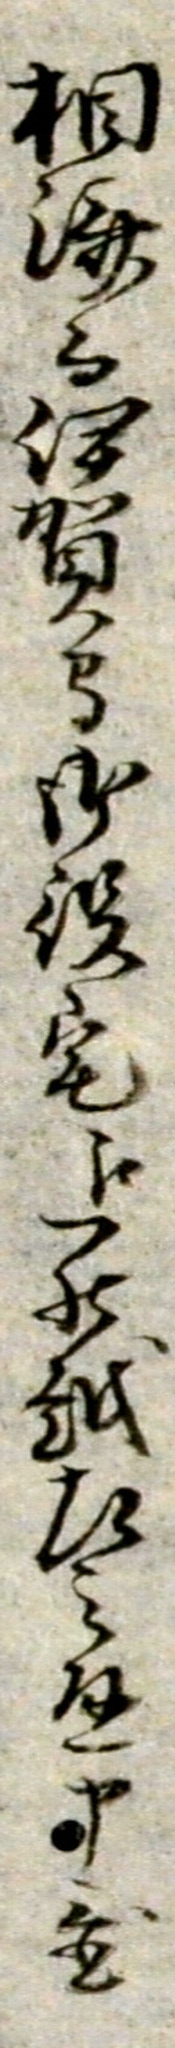相済而伊賀守御役宅江罷越左之通申置
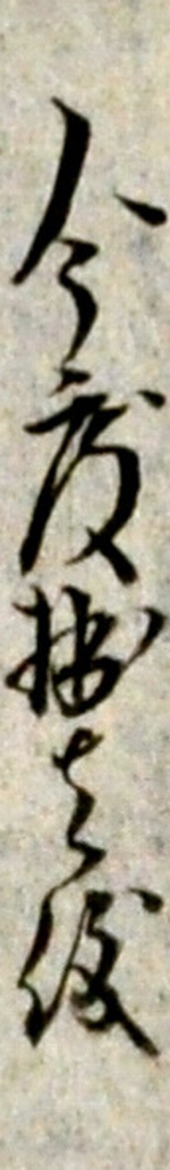今度拙者儀
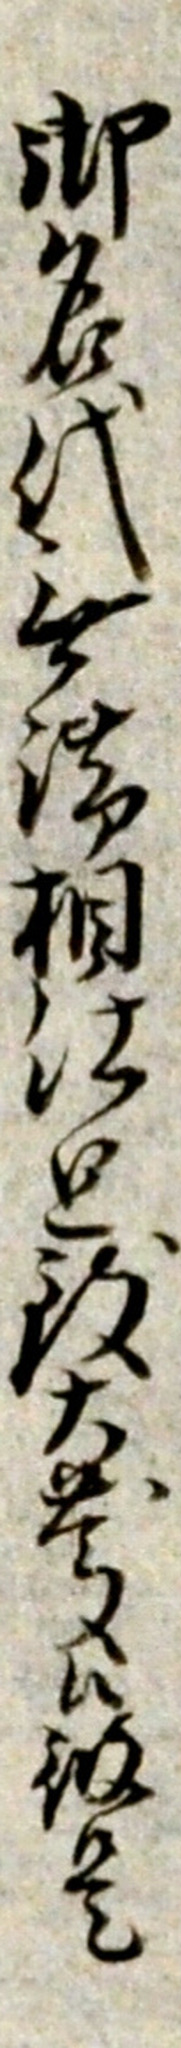御名代無滞相仕廻致大慶候彼是
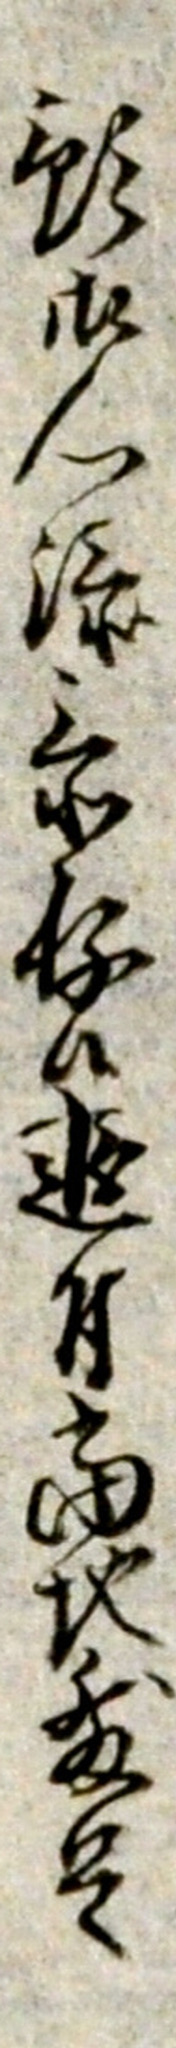預御心添忝存候追付当地発足
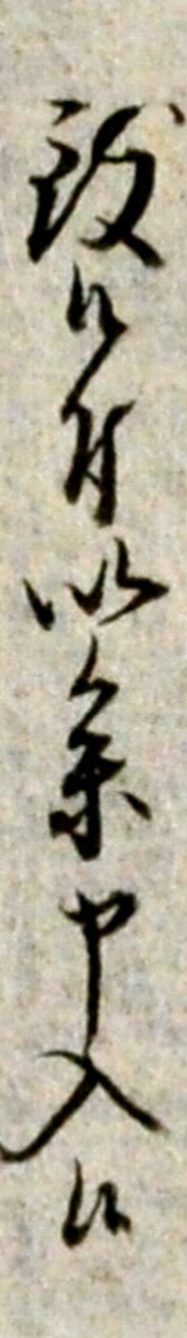致候付以参申入候
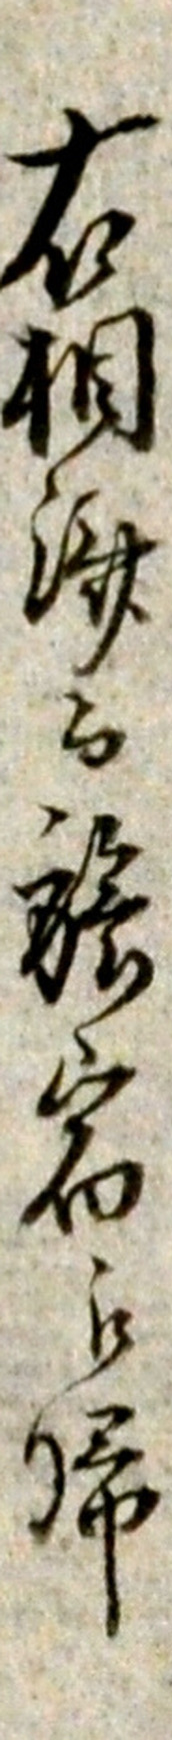右相済而旅宿江帰
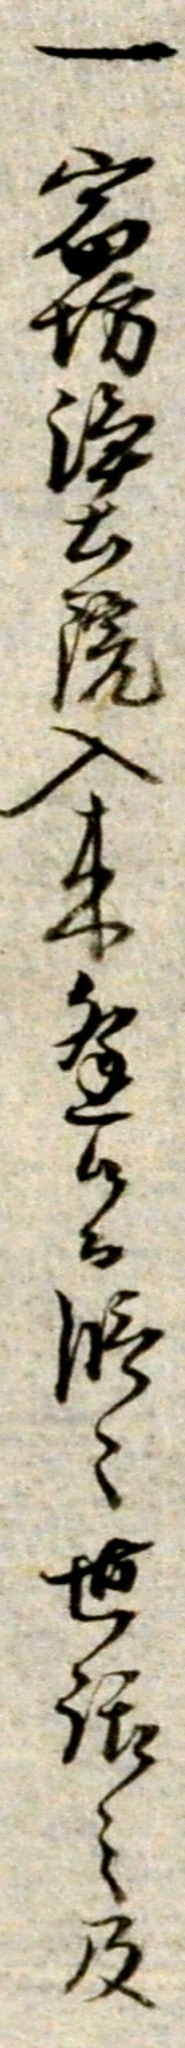一宿坊浄土院入来逢候而段々世話之及
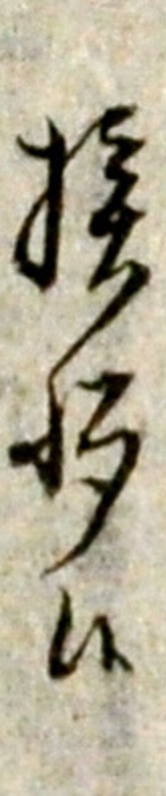挨拶候
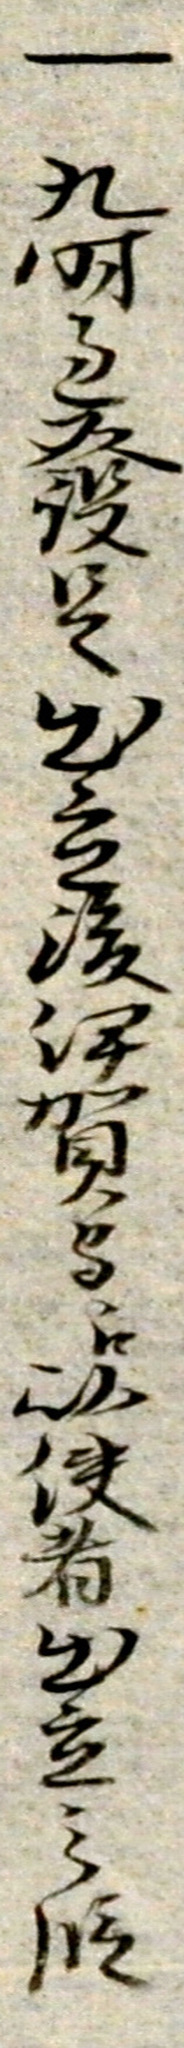一九時過発足出立後伊賀守江以使者出立之段
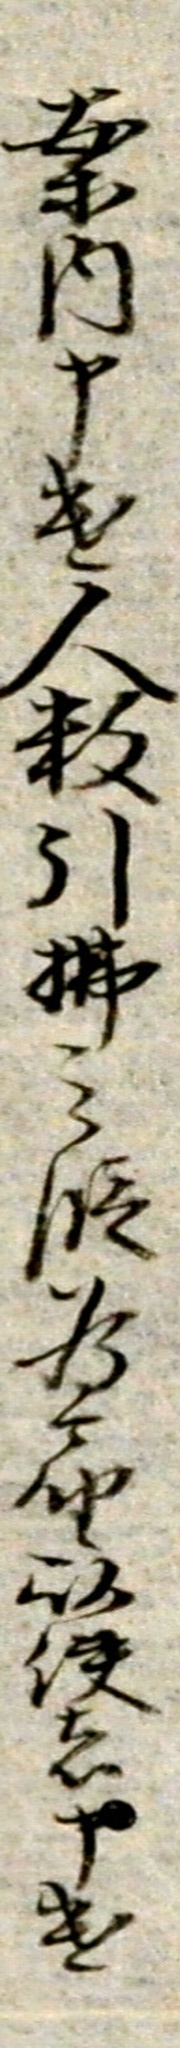案内申遣人数引払之段為届以使者申遣
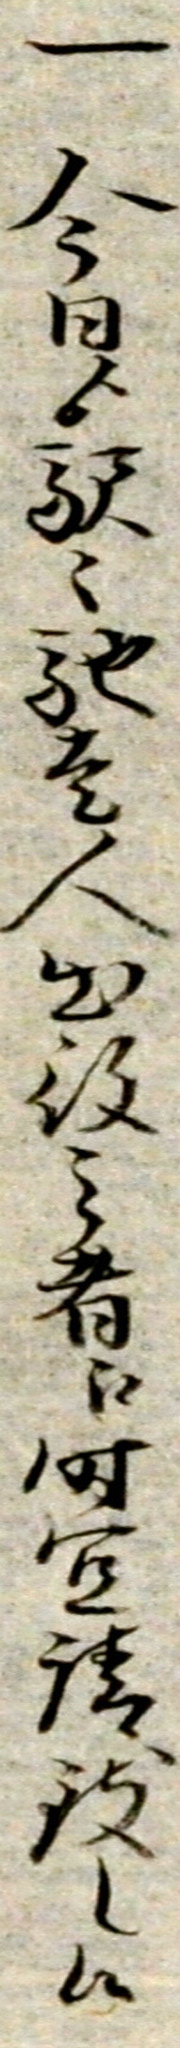一今日ゟ駅々馳走人出役之者江時宜請致し候
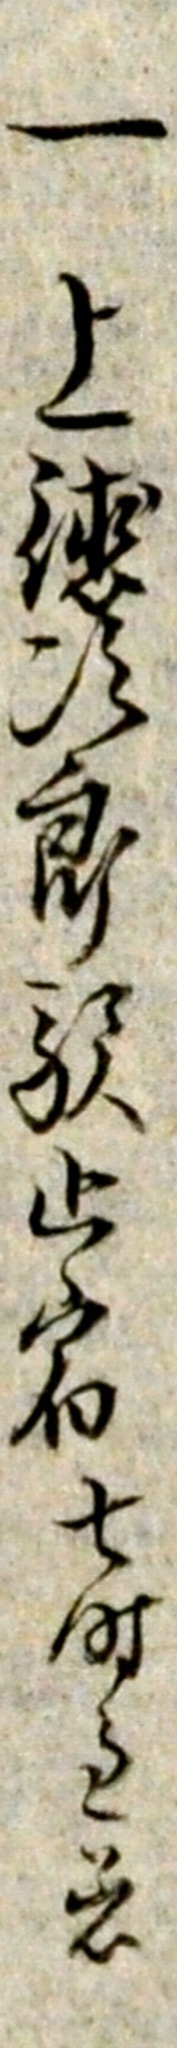一上徳次郎駅止宿七時過着
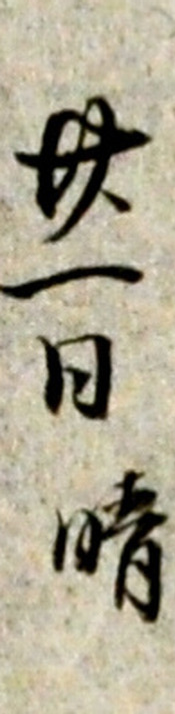廿一日晴
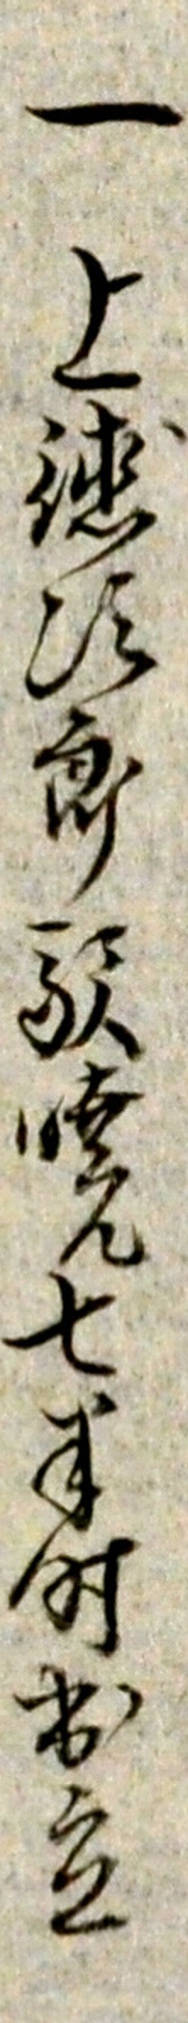一上徳次郎駅暁七半時出立
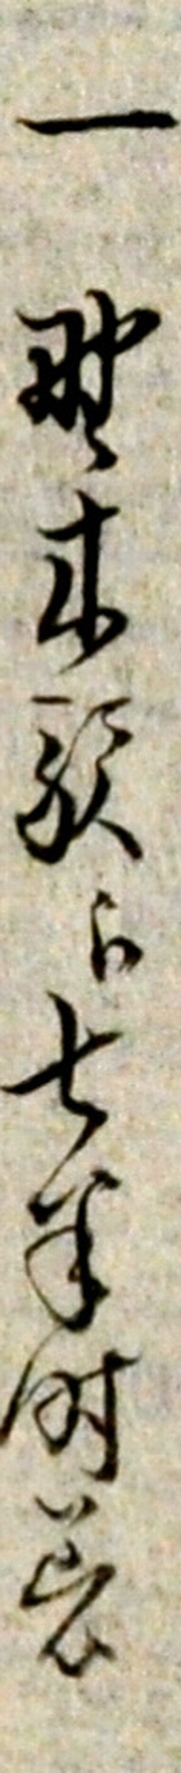一野木駅江七半時着
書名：日光御名代相勤候節ノ留
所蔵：伊那市立高遠町図書館・合同会社AMANE
